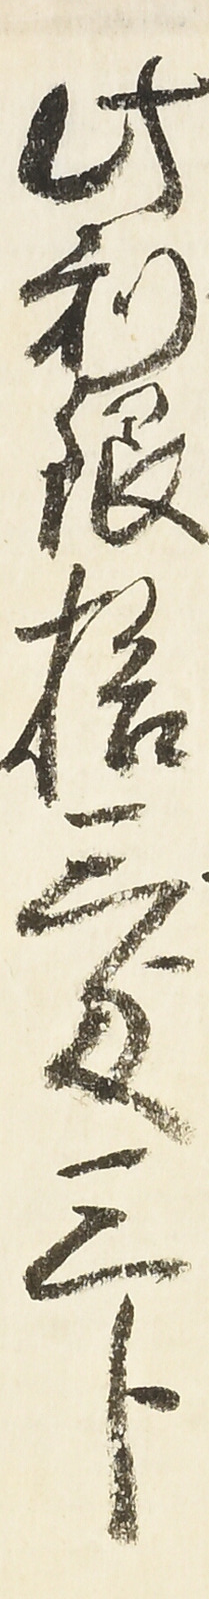此利銀拾三匁三分
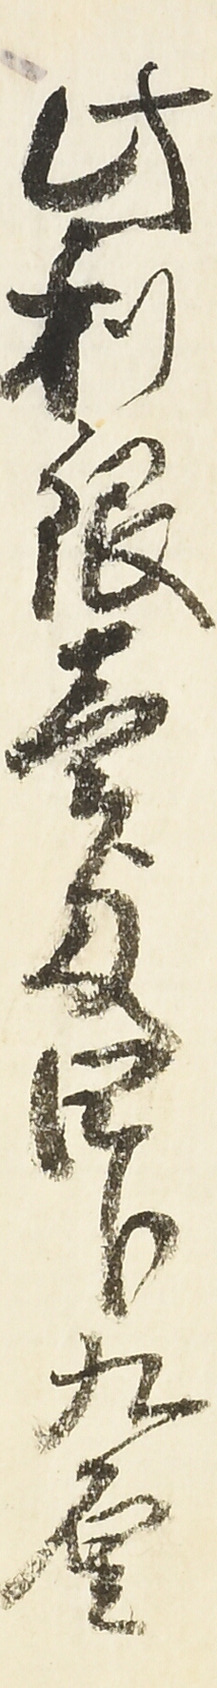此利銀壱匁四分九厘
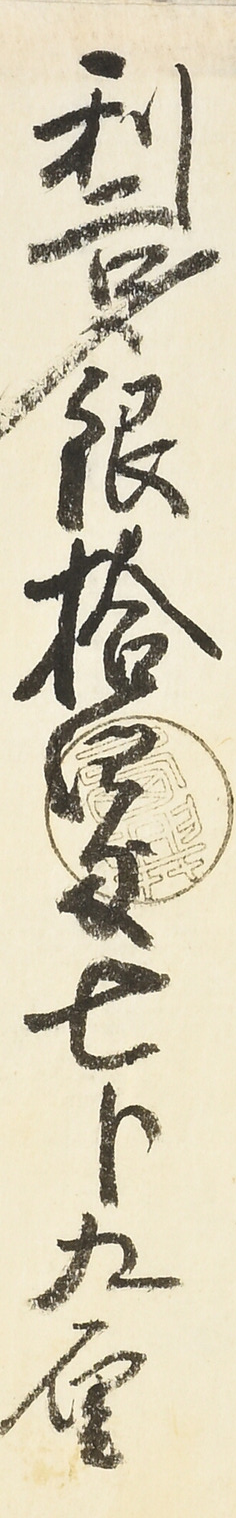利二口〆銀拾四匁七分九厘
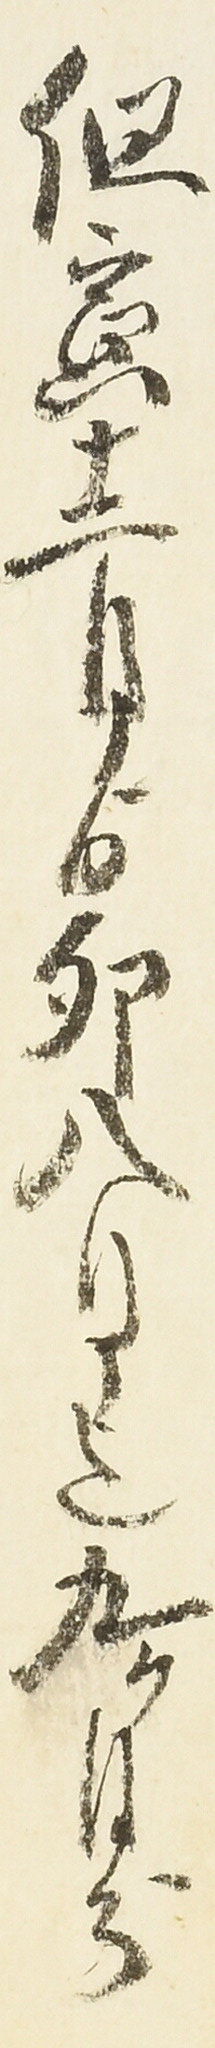但寅十二月ゟ卯八月迄九ヶ月分
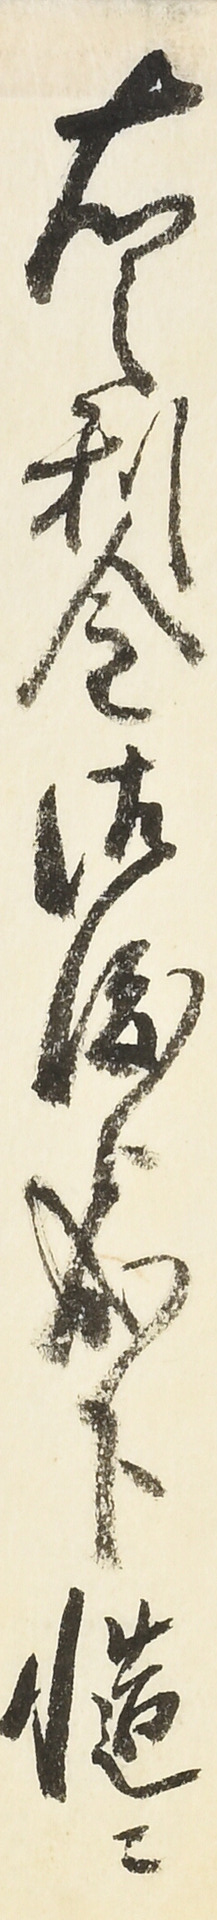右之利金御渡被成下慥ニ
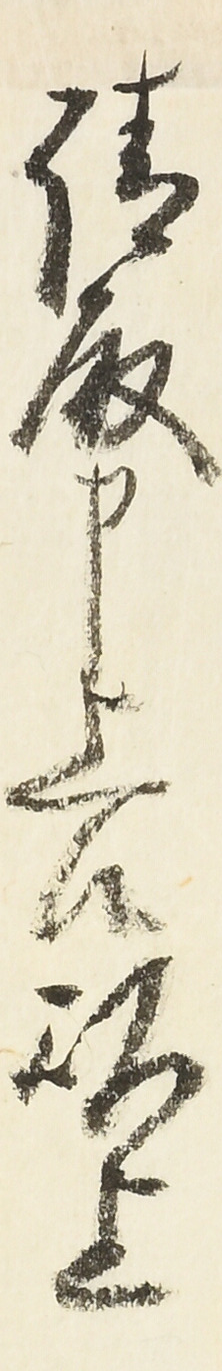請取申上候以上
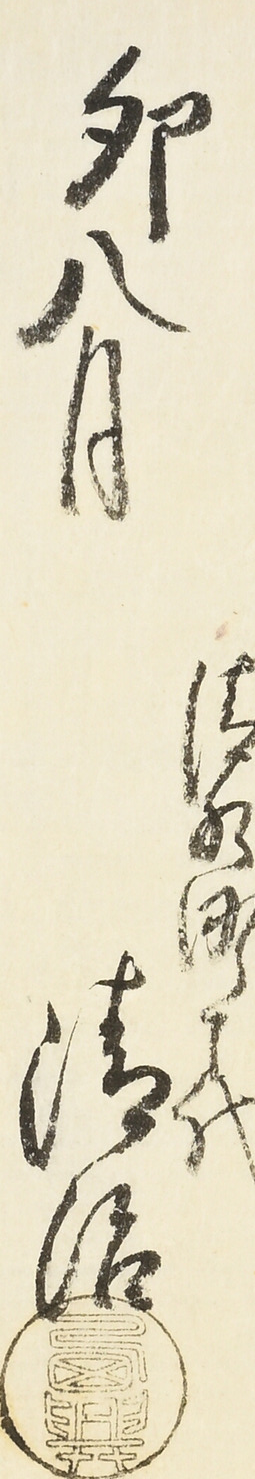卯八月清治
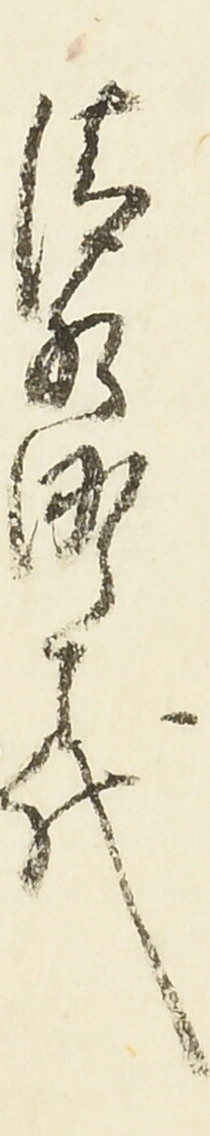清水町丁代

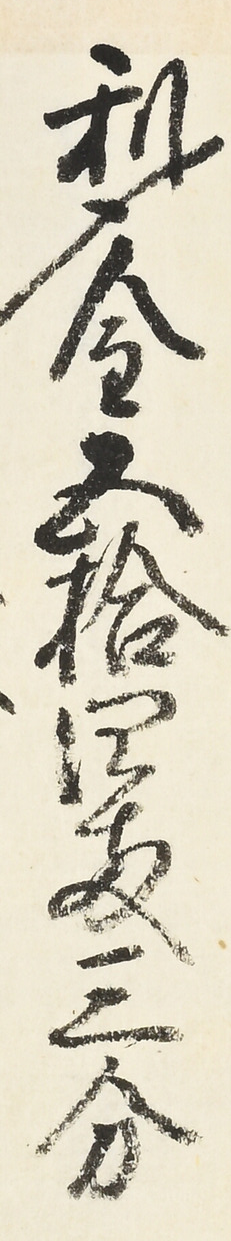利〆金五拾四両三分
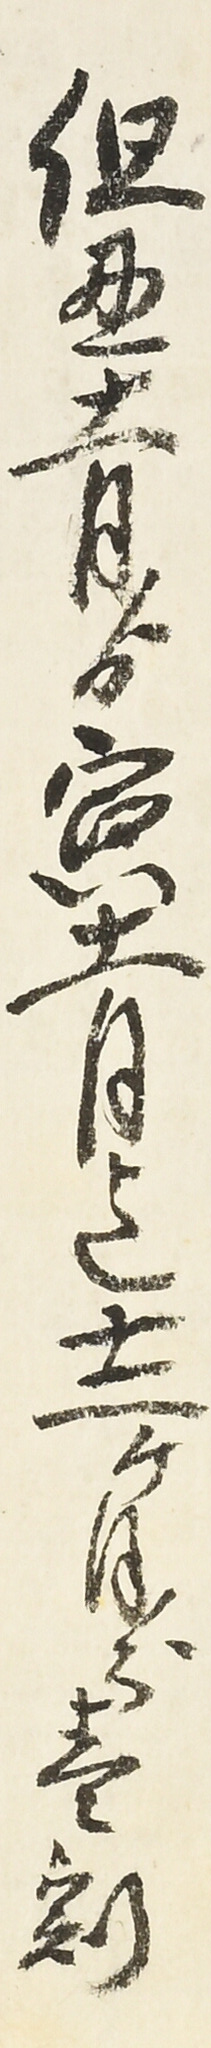但丑十一月ゟ寅十一月迄十二ヶ月分壱割
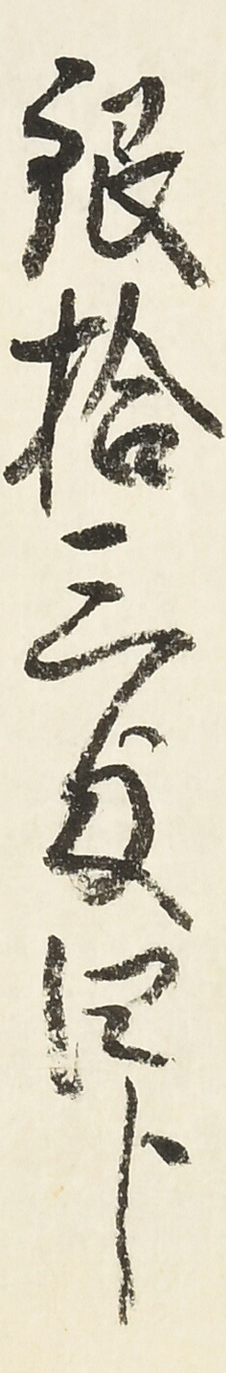銀拾三匁四分
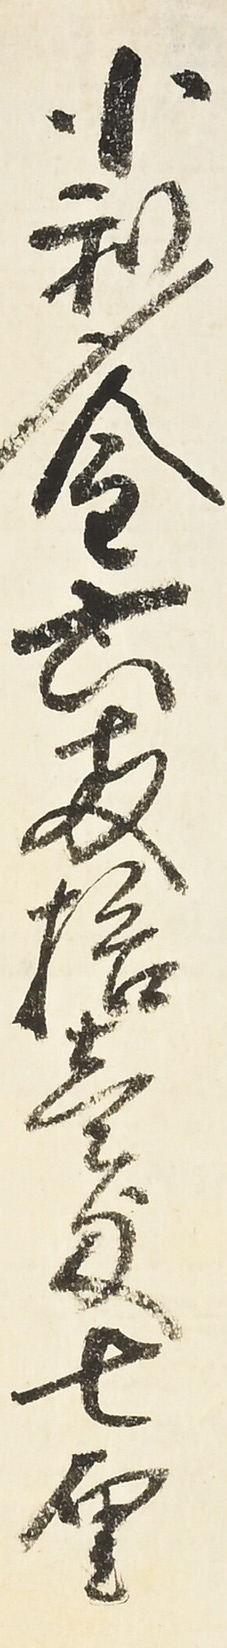小利〆金六両拾壱匁七厘
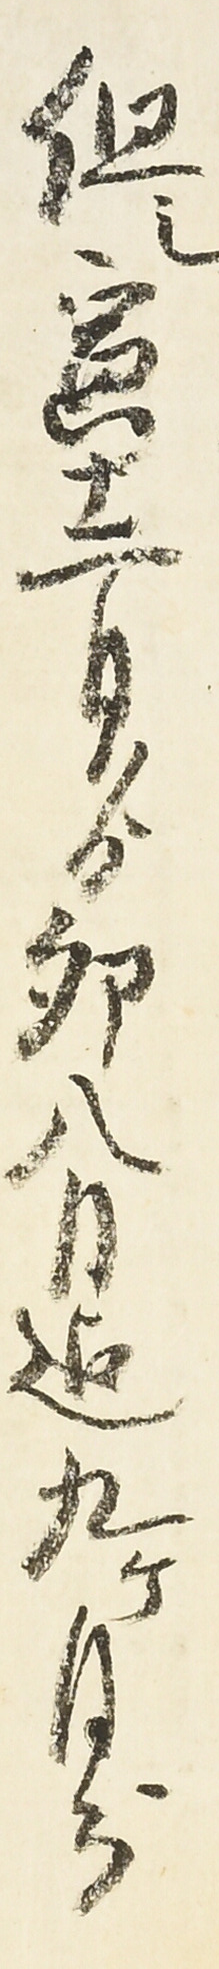但シ寅十二月ゟ卯八月迄九ヶ月分
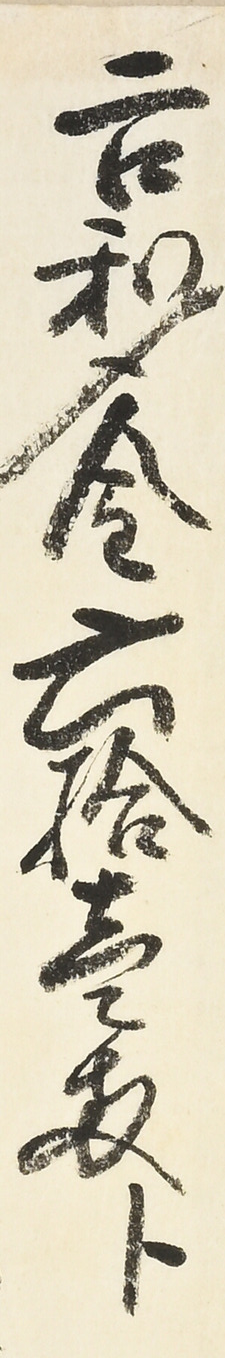二口利〆金六拾壱両ト
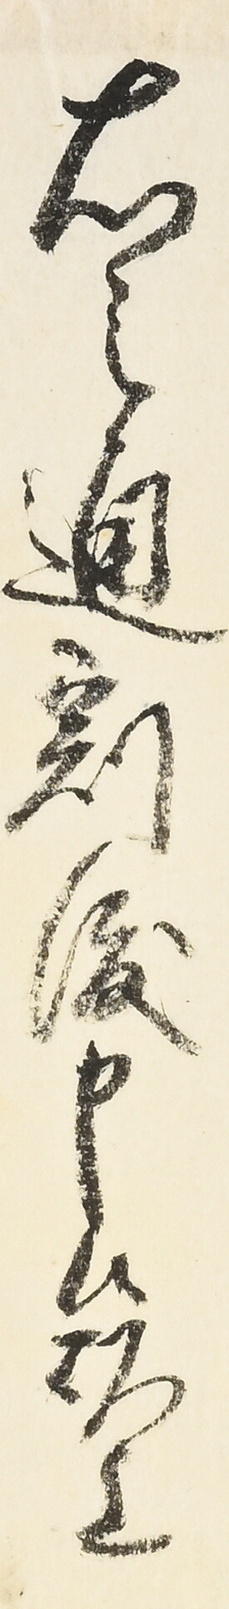右之通割渡申候以上
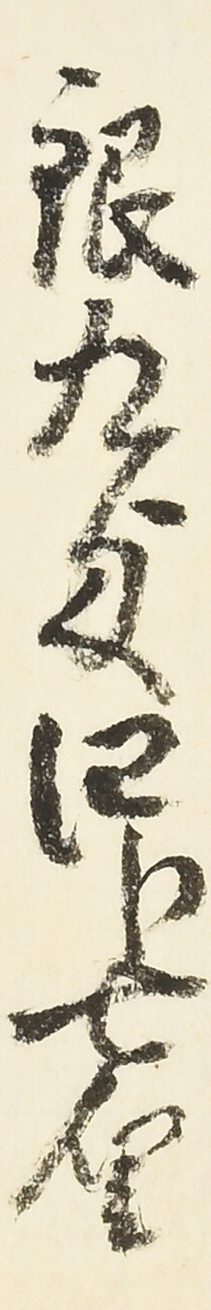銀九匁四分七厘
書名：御才覚金御利足割渡扣帳
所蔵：伊那市立高遠町図書館・合同会社AMANE
